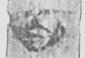百
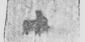十
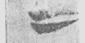二
